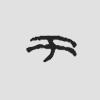于
